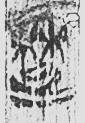楚
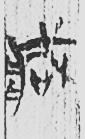戕
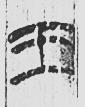王
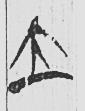立
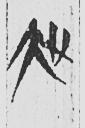吳
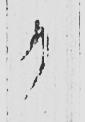人
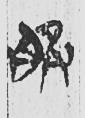服
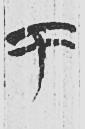于
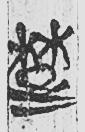楚
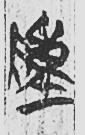陳
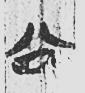公
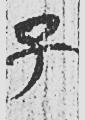子
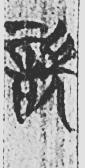{言山一王}
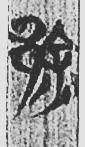{余阝}
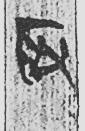取
